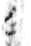㠯（以）
